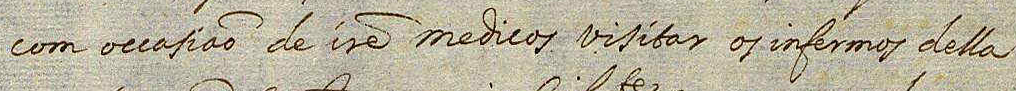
com occasião de irē medicos visitar os infermos della
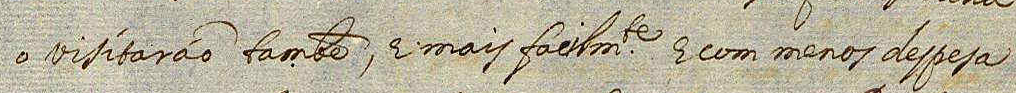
o visitaraõ tambē, e mais facilm.te E com menos despesa
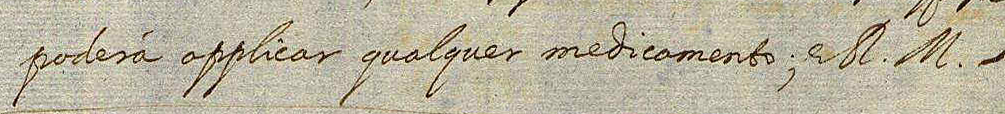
poderá applicar qualquer medicamento; E R. M.
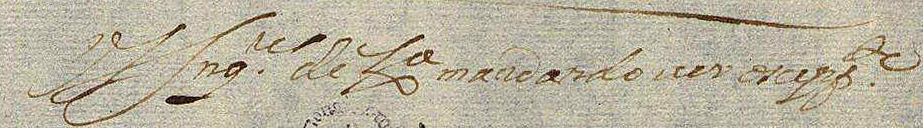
OS Jnq.res de Lxa mandando uer o supp.te
